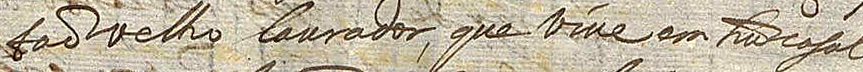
taõ velho laurador, que viue em hū casal
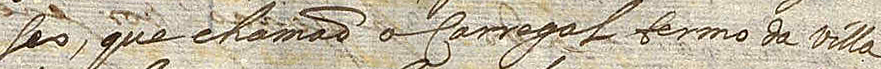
seo, que chamaõ o CarregaL termo da villa
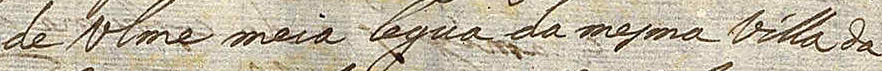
de Vlme meia legua da mesma Villa da
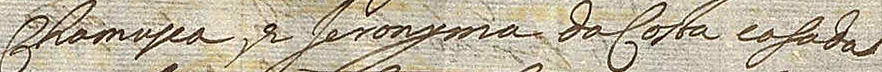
Chamusca, E Jeronyma da Costa casada
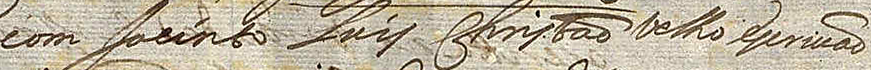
com Jacinto Luis Christaõ velho escriuaõ
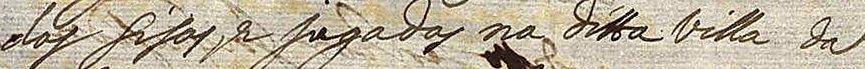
das sisas, E jugadas na ditta villa da
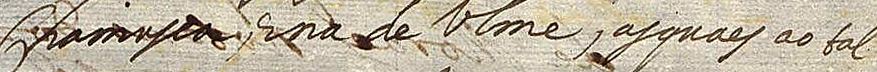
Chamusca, E na de Vlme, as quaes ao tal
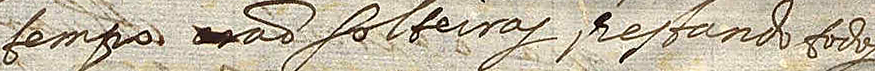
tempo eraõ solteiras, E estando todos
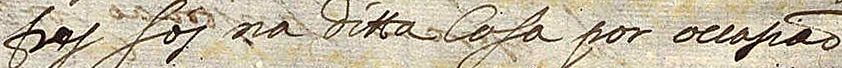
tres sos na ditta Casa por occasiaõ
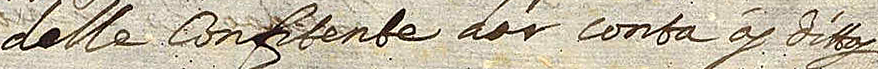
delle Confitente dar conta ás dittas
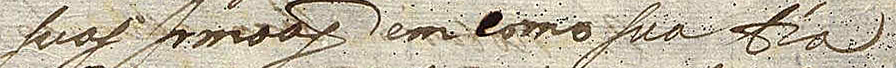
suas Jrmaãs em como sua tia
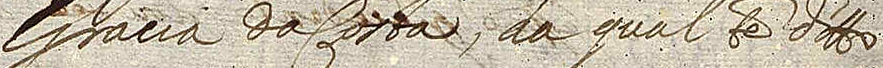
Gracia da Costa, da qual tē ditto
